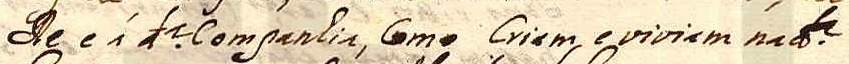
Re, e á d̄a. companhia, como criam, e viviam na d̄.a
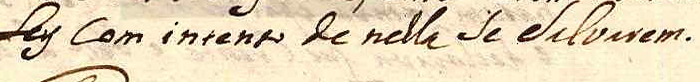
Ley com intento de nella Se Salvarem.
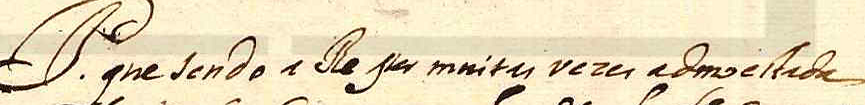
P.e que sendo a Re por muitas vezes admoestada
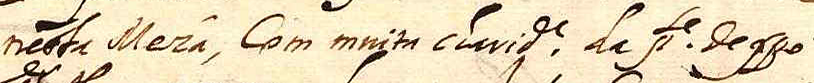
nesta Meza, Com muita charid.e da pte. de xpō
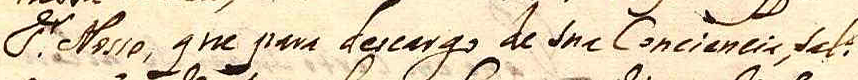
S.or Nosso, que para descargo de sua Conciencia, sal
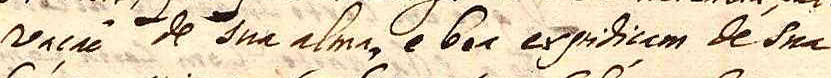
vaçaõ de sua alma, e boa expidiçam de sua
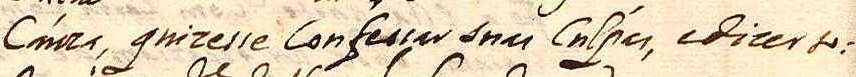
cauza, quizesse Confessar suas Culpas, e dizer to
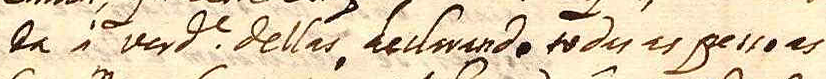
da à verd.e dellas, declarando todas as pessoas
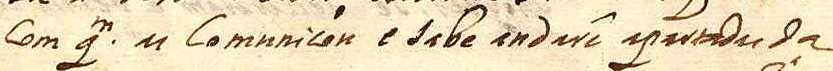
com qm. as Comunicou e sabe andarē apartadas da
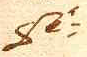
fé
